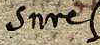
Snrēs
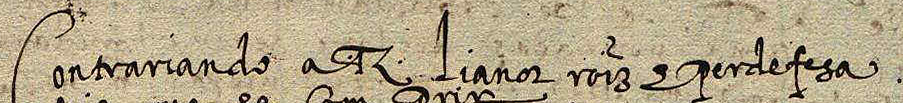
Contrariando a R. Lianor roīz E per defesa
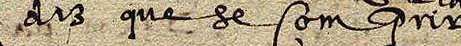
diz que se Comprir
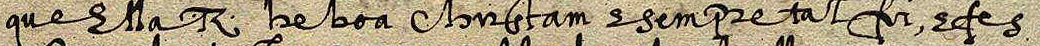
que Ella R. he boa christam E sempre tal foi, E fes
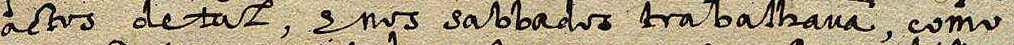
actos de tal, E nos sabbados trabalhaua, como
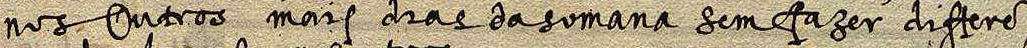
nos Outros mais dias da somana sem fazer differē
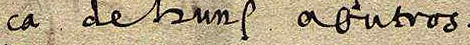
ça de huns a Outros.
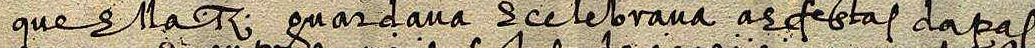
que Ella R. guardaua E celebraua as festas da pas
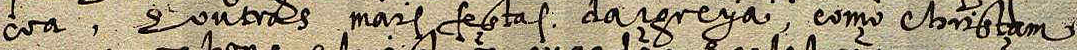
coa, E outras mais festas da igreija, como christam
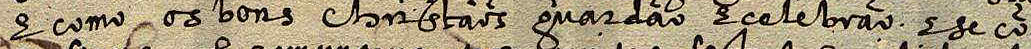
E como os bons christaõs guardão E celebrão E se cō
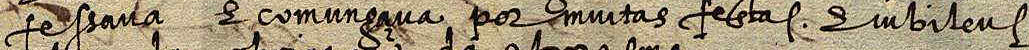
fessaua E comungaua por muitas festas E iubileus
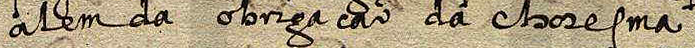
alem da obrigaçaõ da choresma.
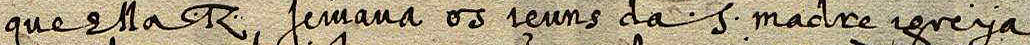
que Ella R. Jeiuaua os ieuns da .S. madre igreija
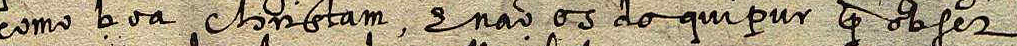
como boa christam, E naõ os do quipur p̄ obser
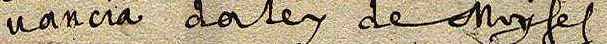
uancia da ley de Moyses.
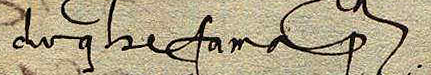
do q̄ he fama p̄ca
